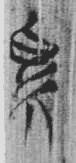○（奚）
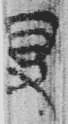○（得）
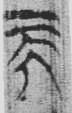而
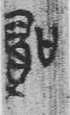鳴
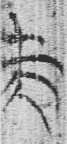夫
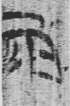雨
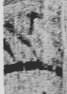之
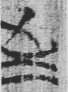至
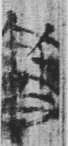{竹亯}（熟）
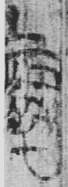{雨垂}（唾）
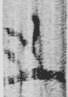之
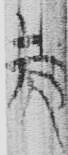夫
